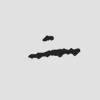二
